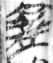寍（寧）
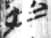於
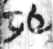卯
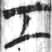工（空）
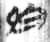於
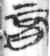晨
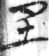坐
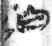於
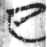巳
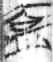盍（蓋）
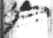於
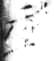城（成）
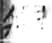於
